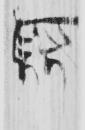聚
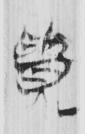{貝爲}
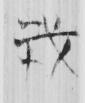戎
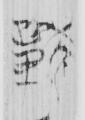獸
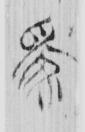{爪家}
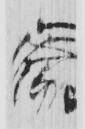{來历}
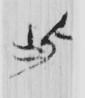此
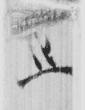之
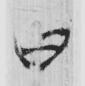曰
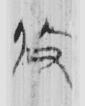攸
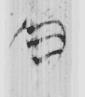今
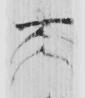夫
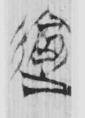逾
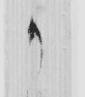人
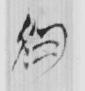於
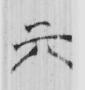亓
